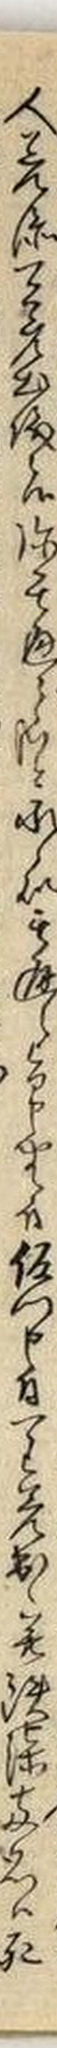人差添可差出儀に候弥其通に候哉と承候処其通之旨被申聞候に付仮門申付可被差出候并鉄漆両御門は死
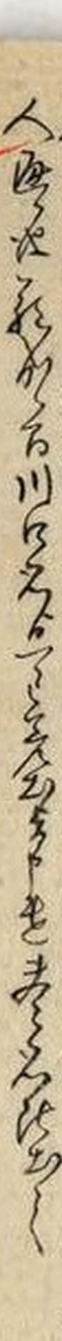人通候儀難成候間川口御門ゟ可被差出旨申遣夫々御門断出之

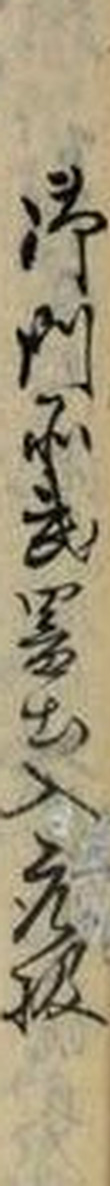御門所武器出入取扱
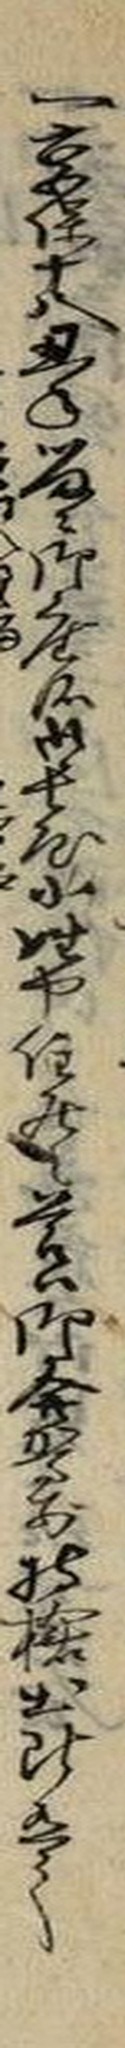一享保十八丑年留に御座所御長屋小姓中住居之節御発駕前持鎗出断有之
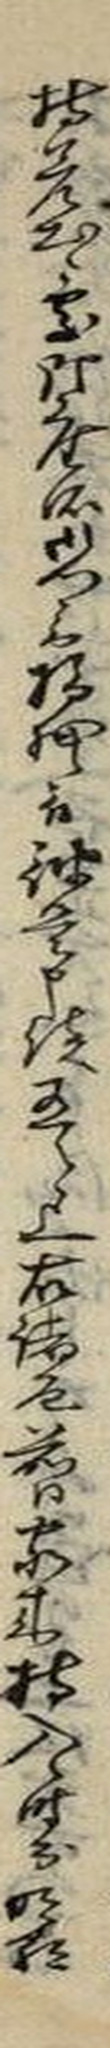持差出候処御座所御門に而指押候付彼是申談有之候上右諸色前日家来持入候時分明朝
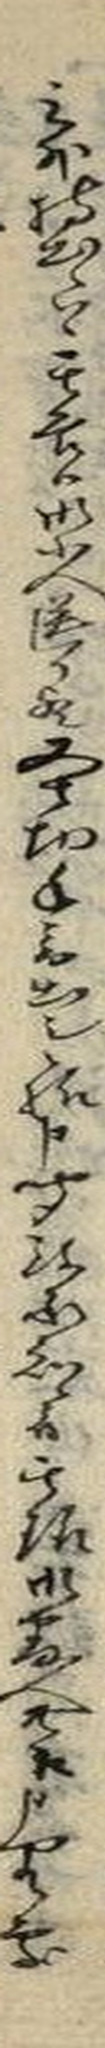之外持出候はゝ其節は御小人送り歟又は切手に而出し候様申聞致承知候に付其趣御番人共江申聞候処
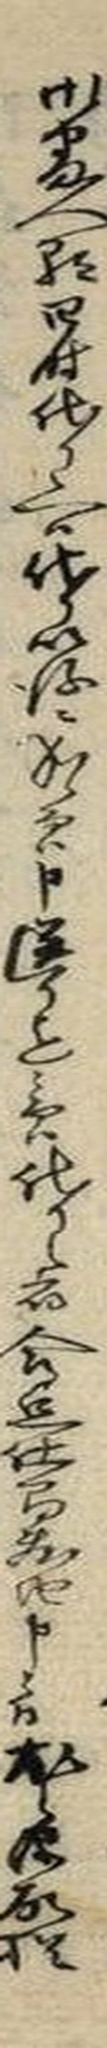御番人朝四時代り候へは代り以後に成候而は申送り迄に而は代り候者合点仕間敷由申に付尤之儀故猶
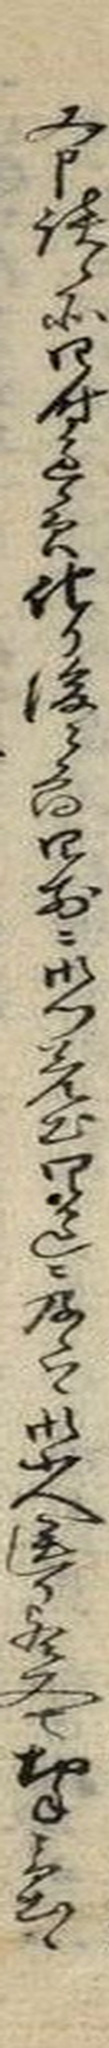又申談候所四時過候而は代り後に候間四前に御門差出四ツ過ニ及候はゝ御小人送り歟又は切手に而出候
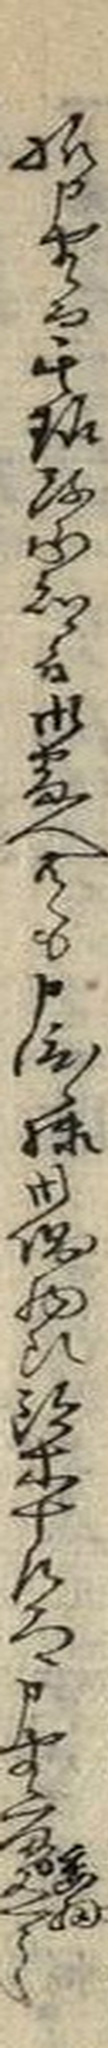様申聞候而其趣致承知候に付御番人共へも申渡候様御側物頭鈴木十左衛門へ申聞留委細有之
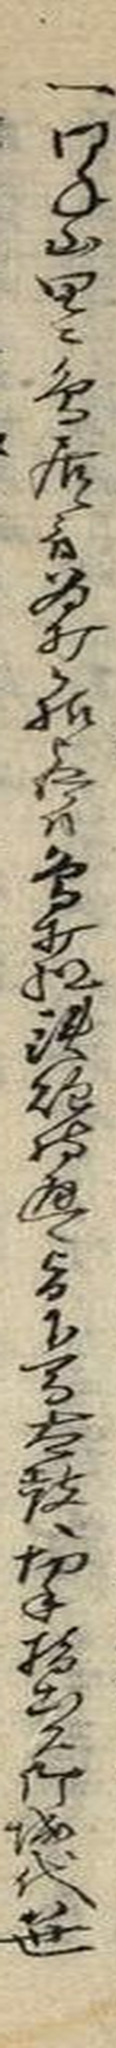一同年山里に鳥居候に付為打候様被仰付候に付鳥打組鉄砲持通候旨下馬太鼓へ切手指出ス御城代笹
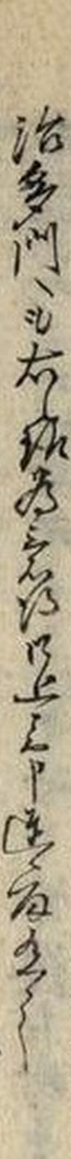治多門へも右之趣為意得口上に而申達候留有之
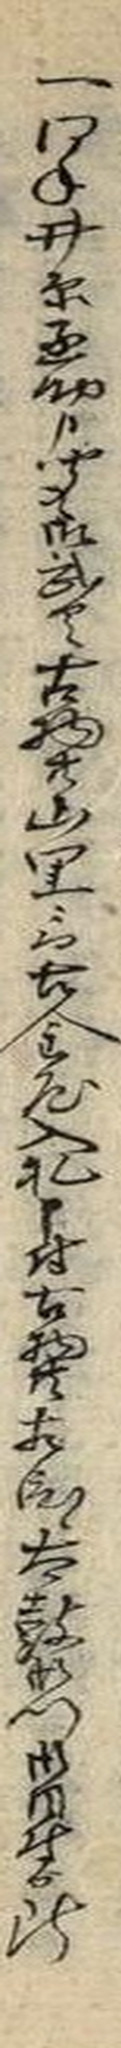一同年井原丞助申聞候御武具古物共山里に而古金屋入札申付古物共相渡候太鼓御門御目付ゟ断
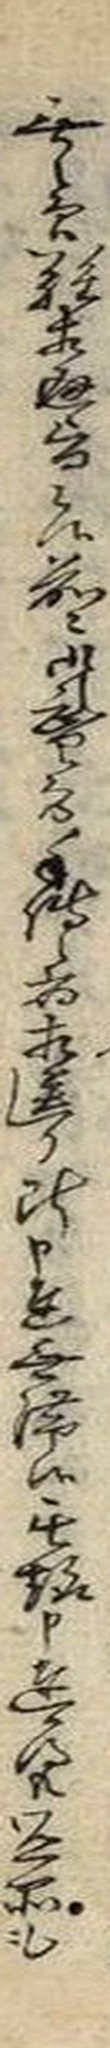無之候而は難相通旨に候前々御武具方手伝之者相送り断申達無滞候其趣申達候得共宜品も
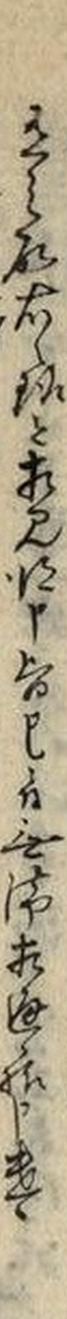有之故右之趣と相見得申旨申候に付無滞相通候様申遣候
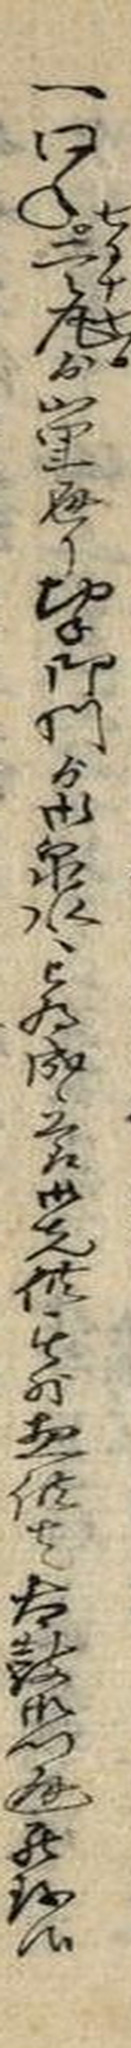一同年七月十七日二之丸ゟ山里通り切手御門ゟ御泉水へ被為成候節御先供其外惣供は太鼓御門通罷越候
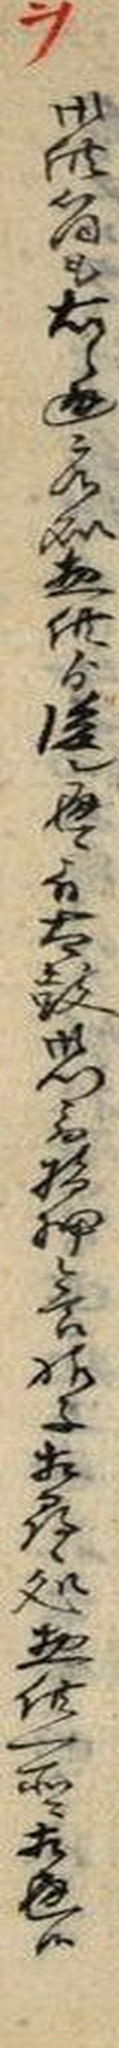御供筒も右之通に候処惣供ゟ後レ通候に付太鼓御門に而指押候節様子相尋候処惣供一所に相通候
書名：御門御櫓之部
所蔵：福井県文書館 Fukui Prefectural Archives
